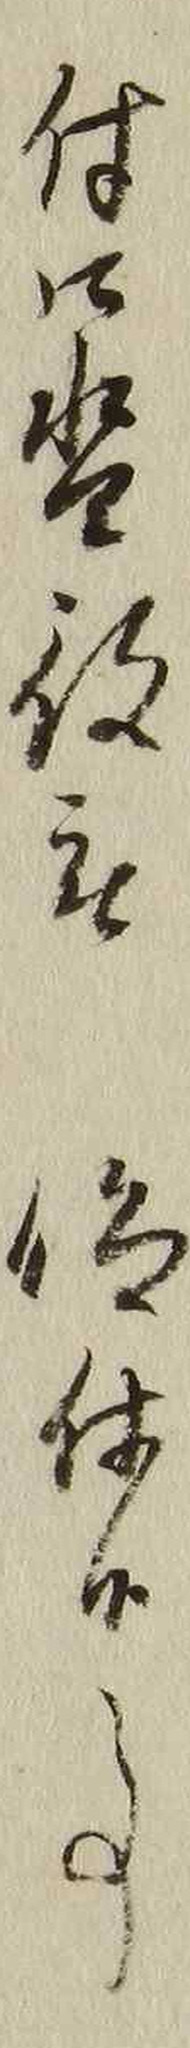付御沓役被仰付候事
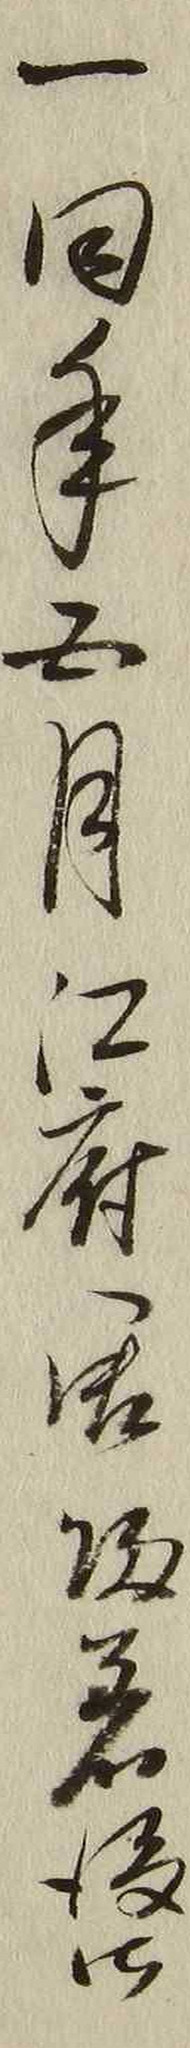一同年五月江府へ御帰着後御
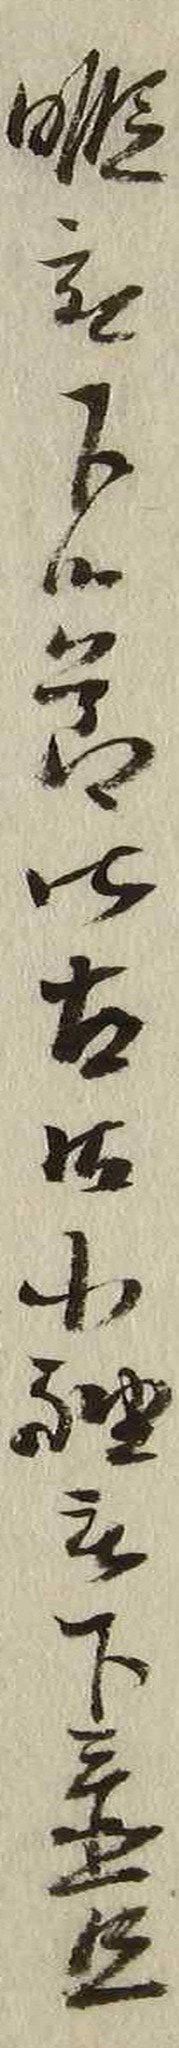暇被下候節古御小袖被下置且
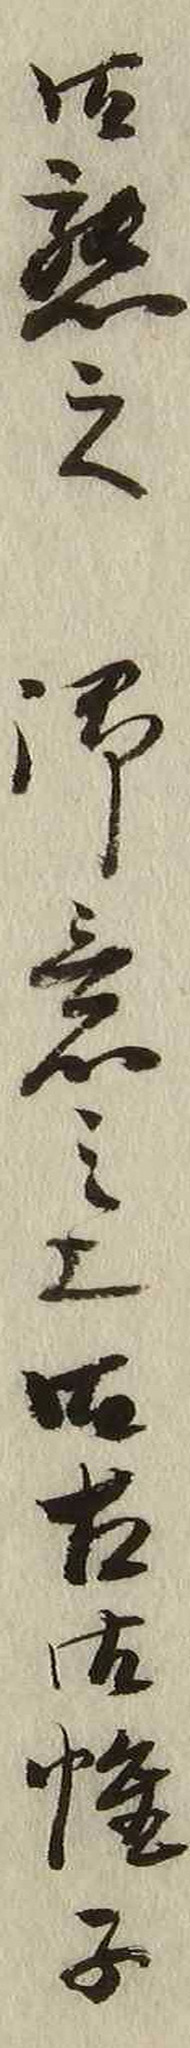御懇之御意之上御古御帷子
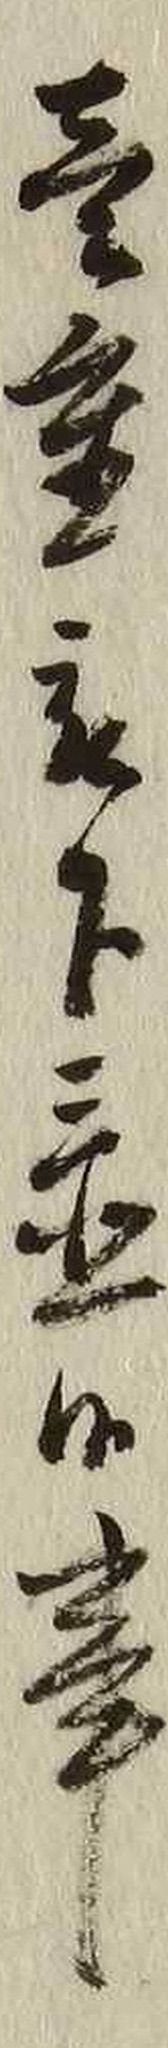壱重被下置候事
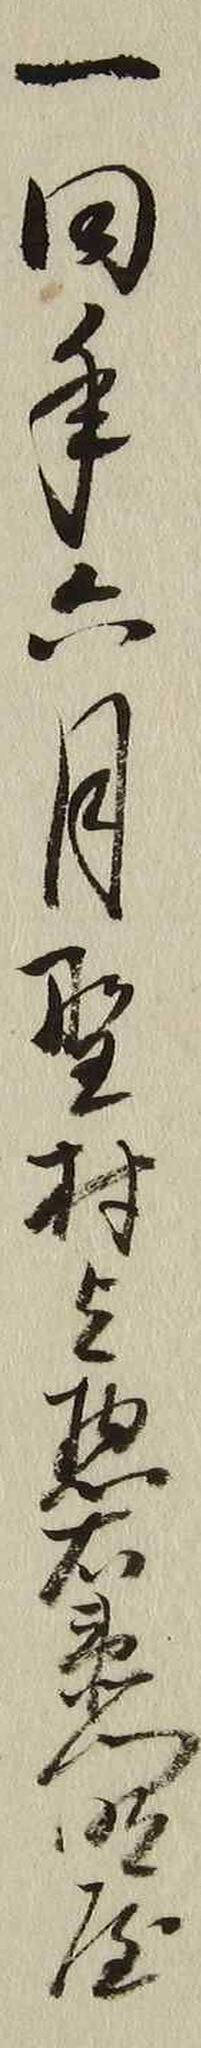一同年六月野村与惣右衛門明屋
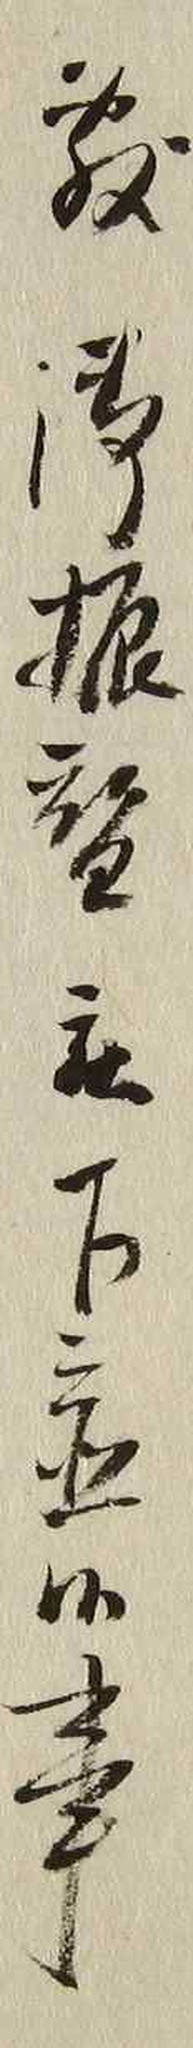敷御振替被下置候事
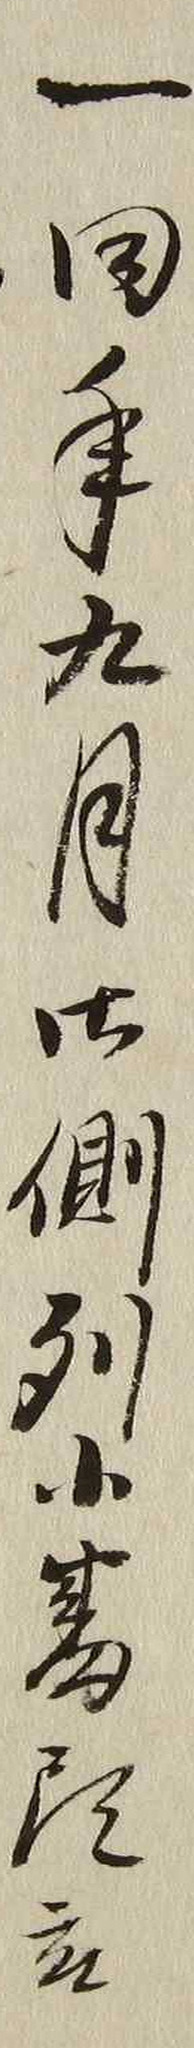一同年九月御側列小番頭被
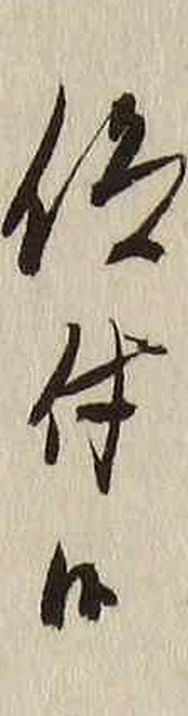仰付候
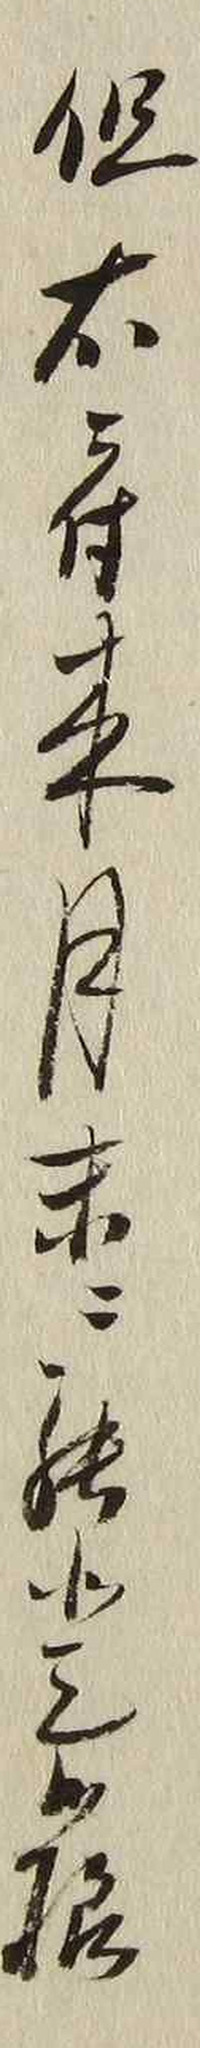但右ニ付来月末ニ罷登候様
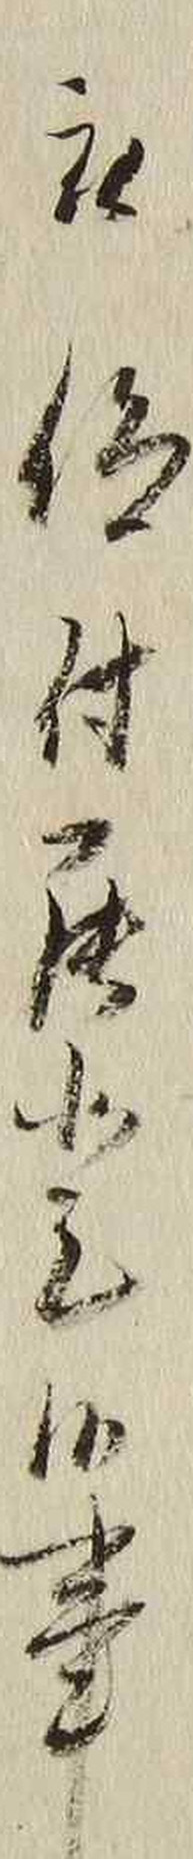被仰付罷登候事
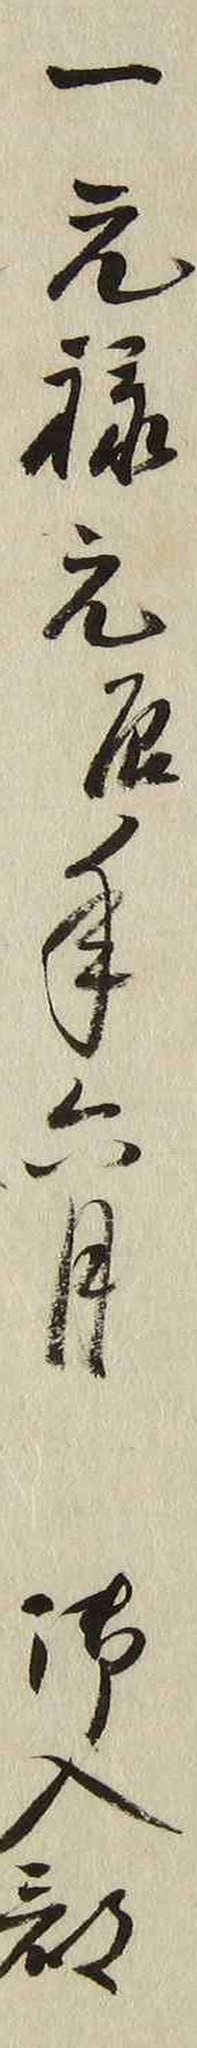一元禄元辰年六月御入部
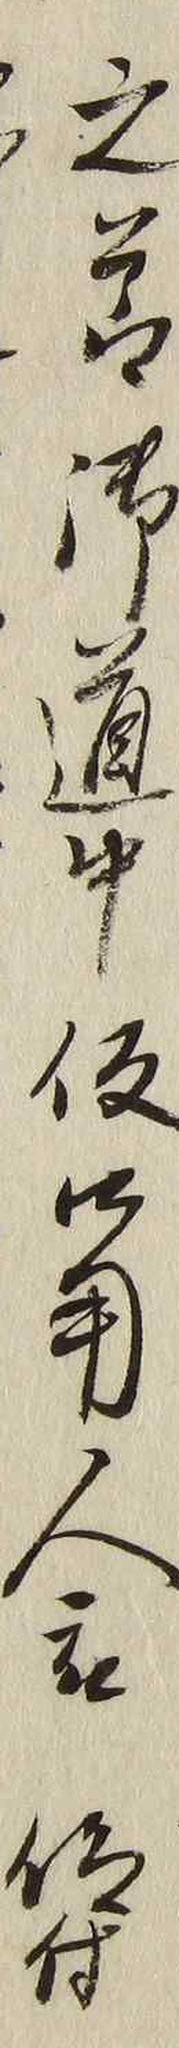之節御道中仮御用人被仰付
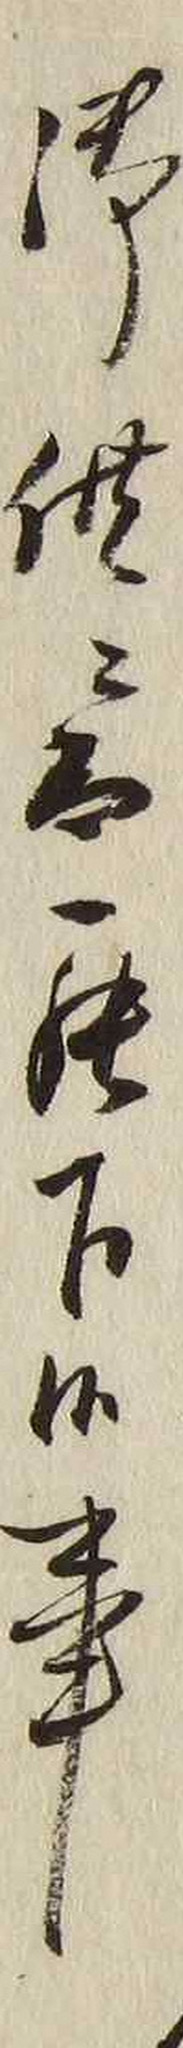御供ニ而罷下候事
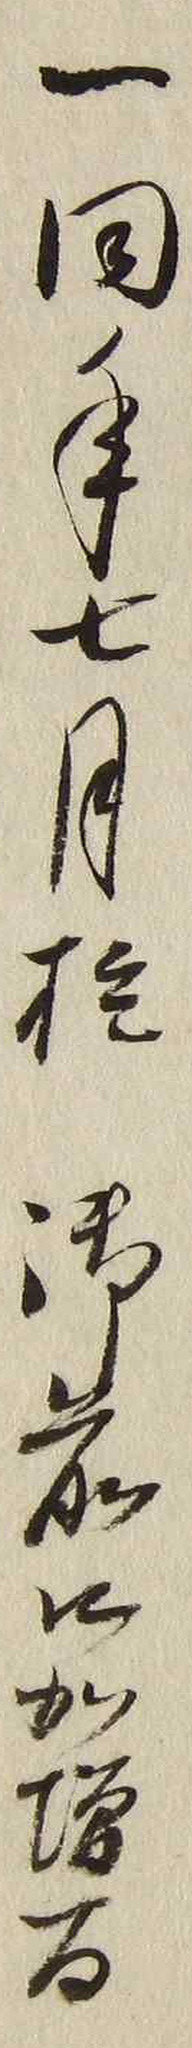一同年七月於御前御加増百
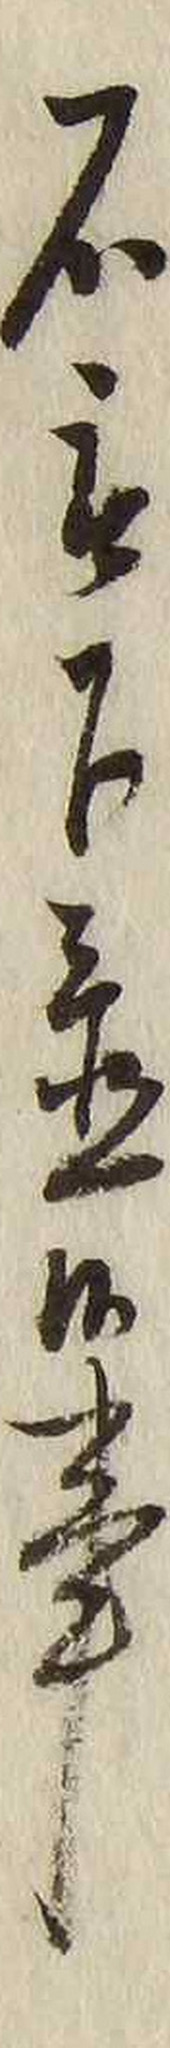石被下置候事
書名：諸士系譜　巻之355　す之部5
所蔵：会津若松市立会津図書館
